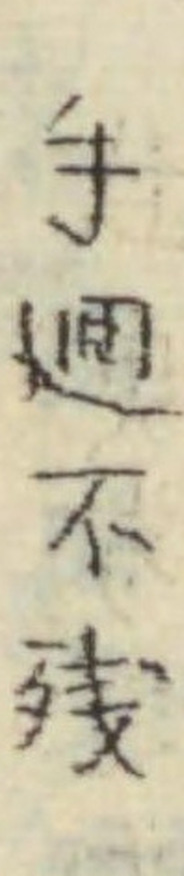手廻不残
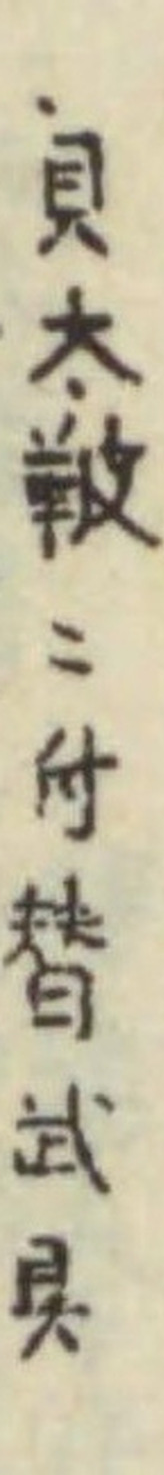貝太鞁二付替武具
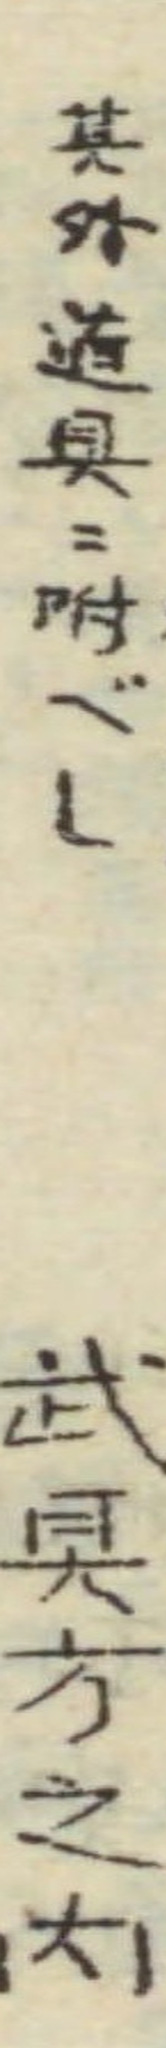其外道具二附べし武具方之内
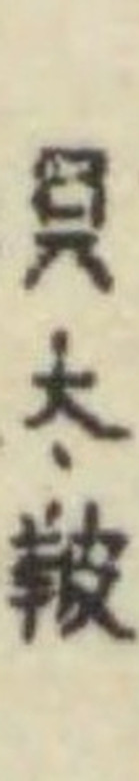貝太鞁
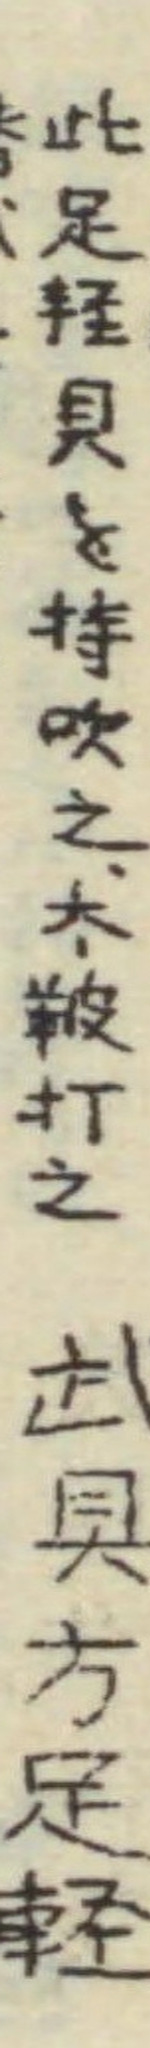此足軽貝を持吹之太鞁之武具方足軽
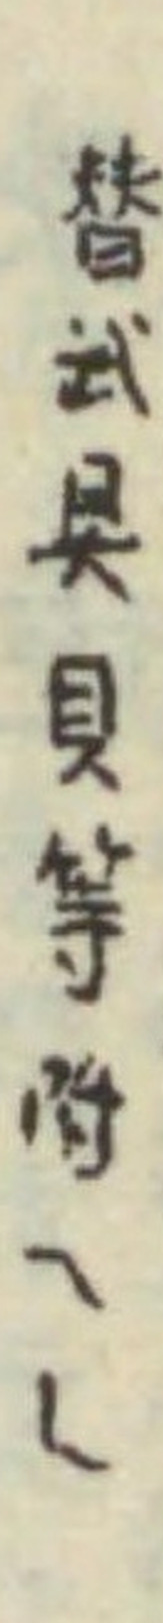替武具貝等附へし
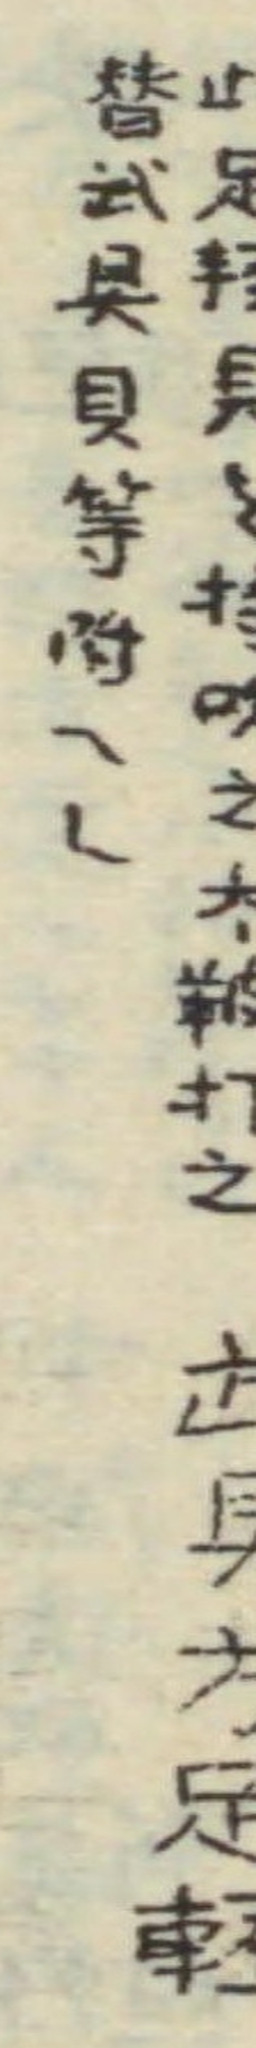替武具貝等附へし
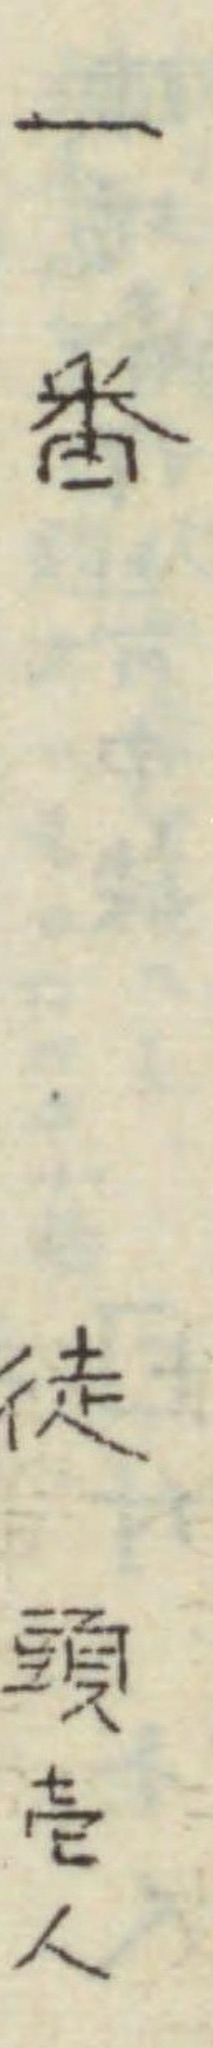一番徒頭壱人
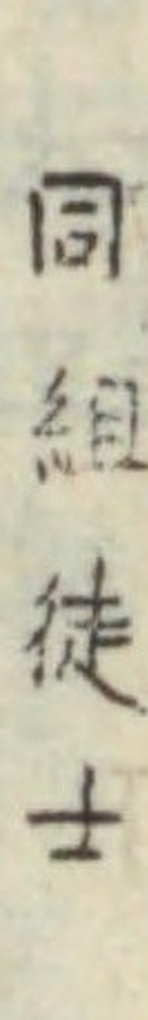同組徒士
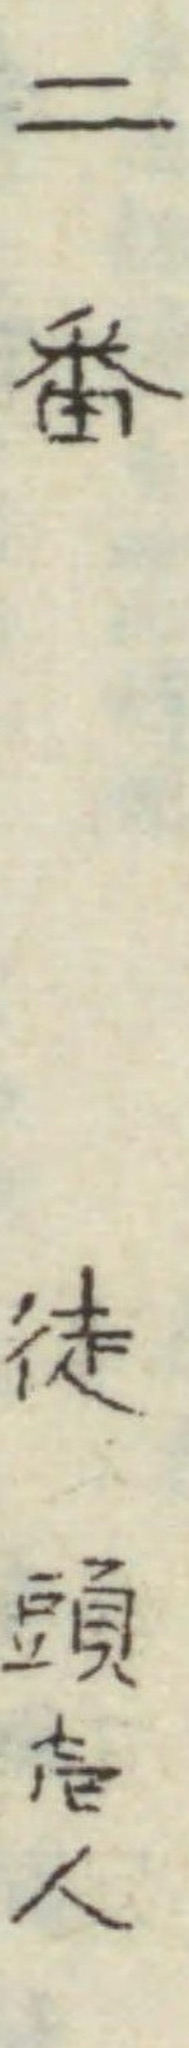二番徒頭壱人
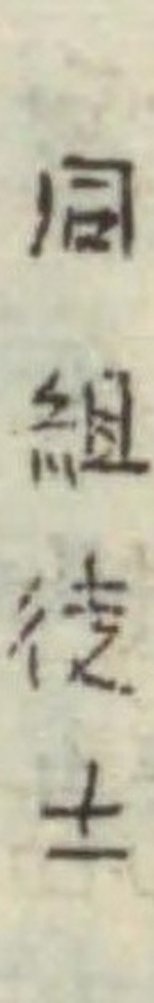同組徒士
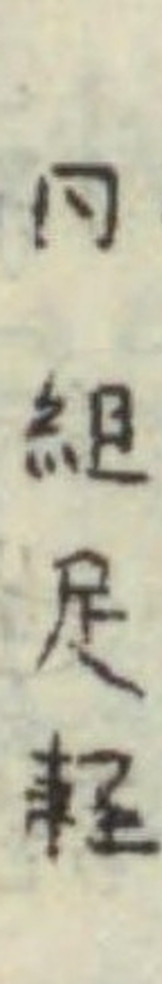同組足軽
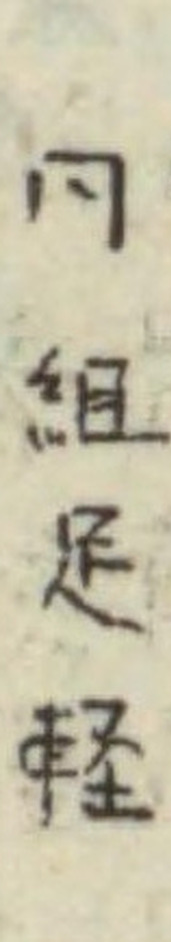同組足軽
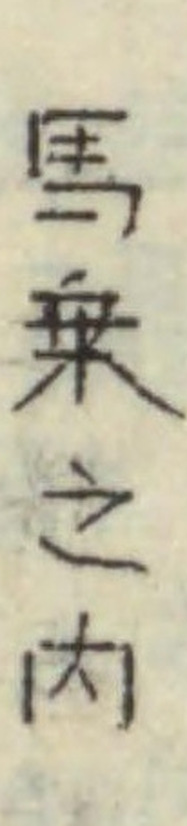馬乗之内
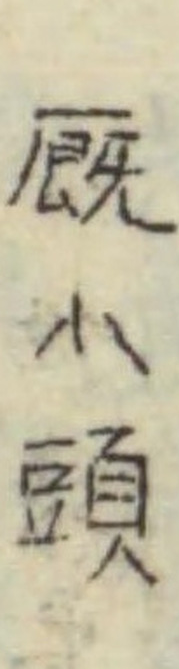厩小頭
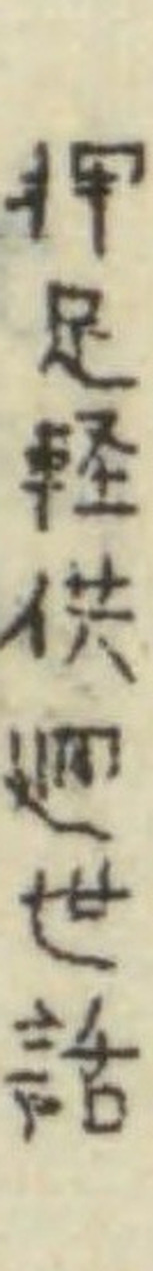押足軽供廻世話
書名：三河吉田藩動員史料
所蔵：国立国会図書館 National Diet Library, JAPAN
